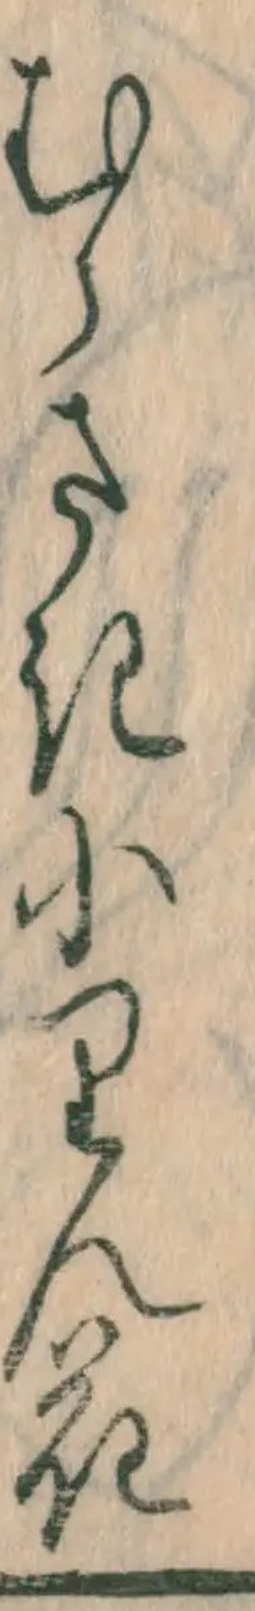むらさき小りん花
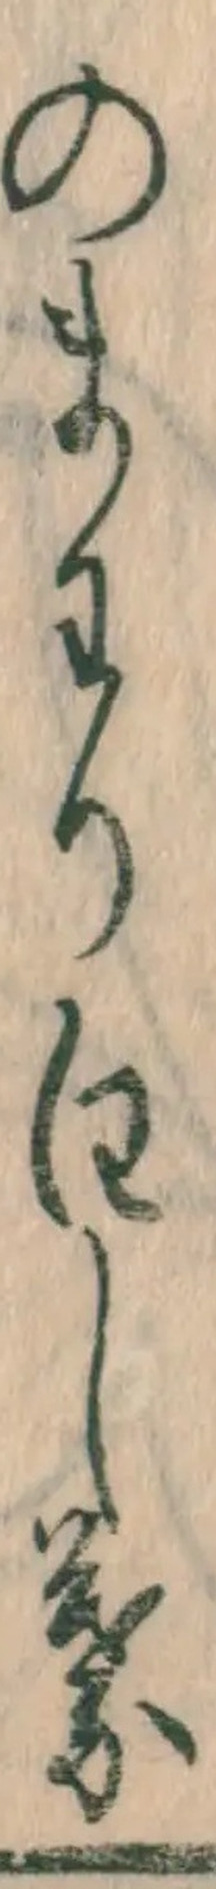のまわり白し葉
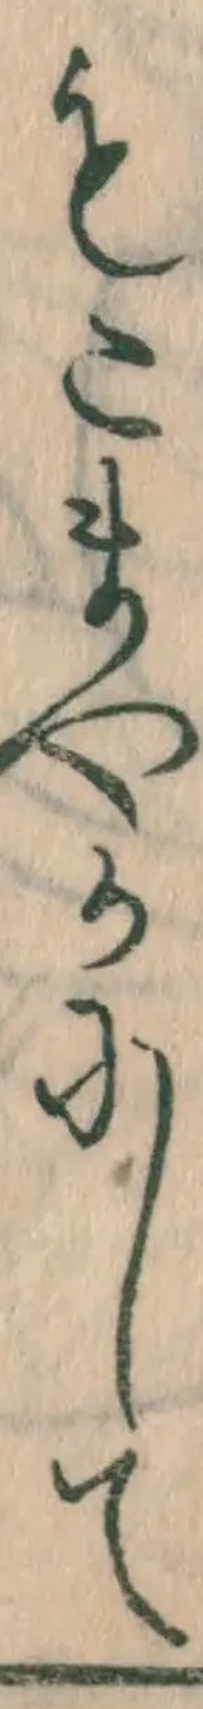もこまやかにして
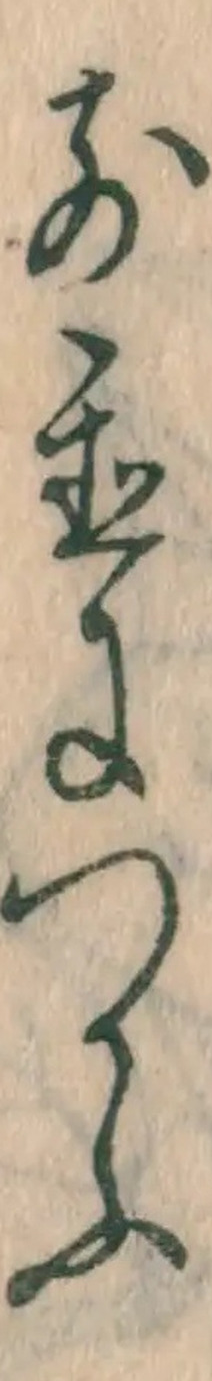前置につかふ

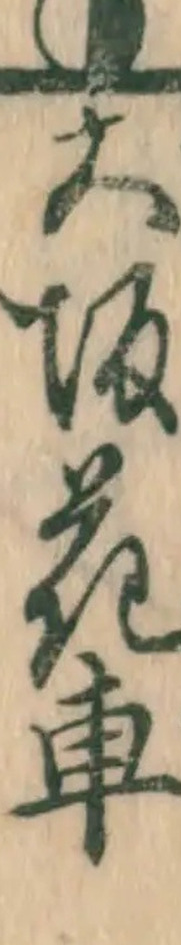大阪花車
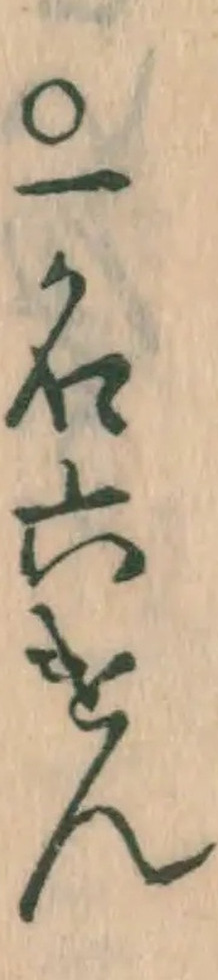○一名六けん
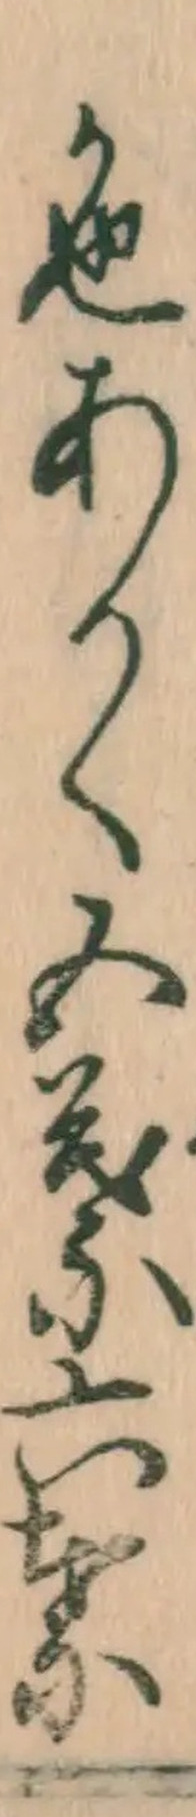色あかく五葉六葉
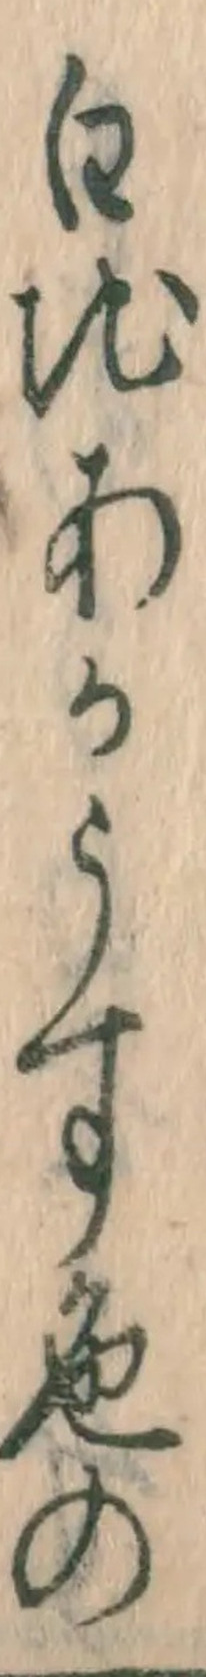白地あかうす色の
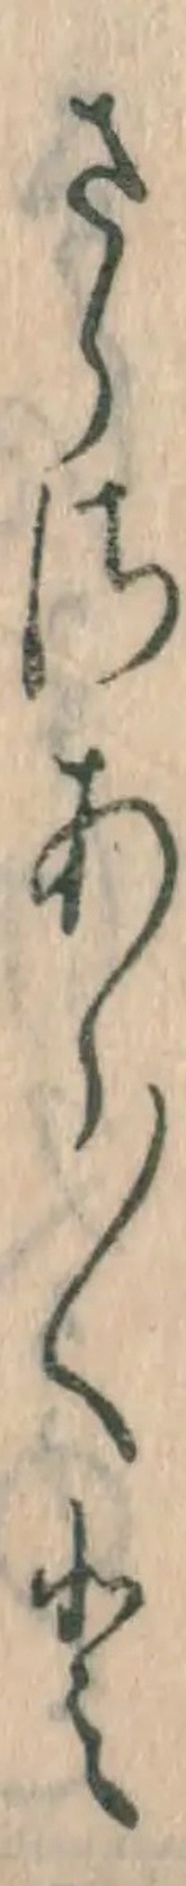さらさあら〳〵と

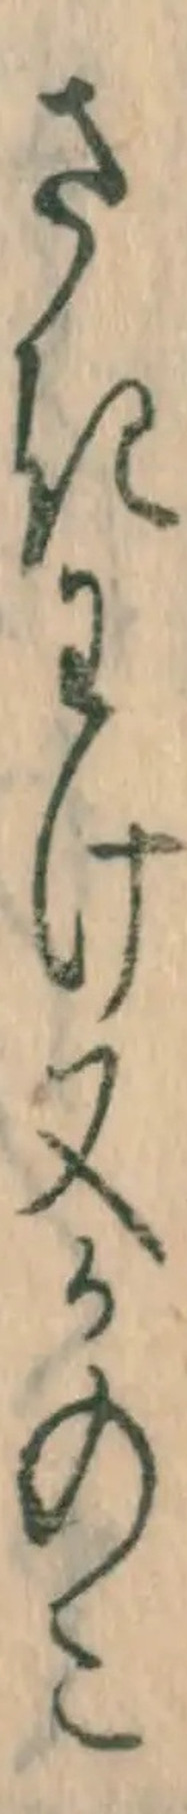さきわけ又かのこ
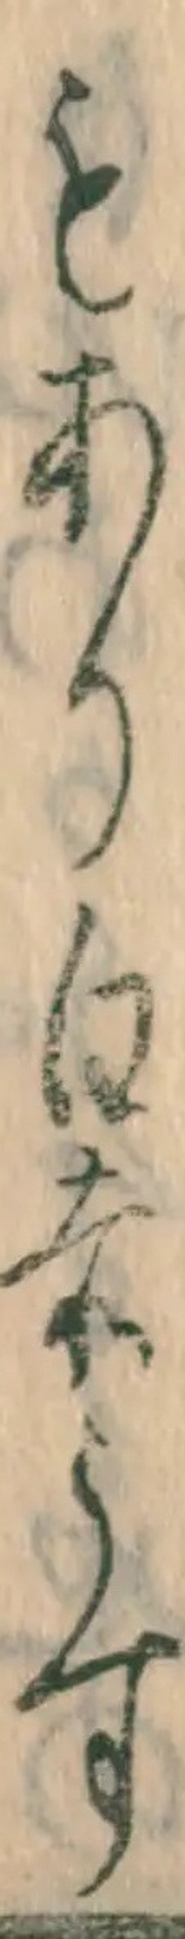もあり白赤うす
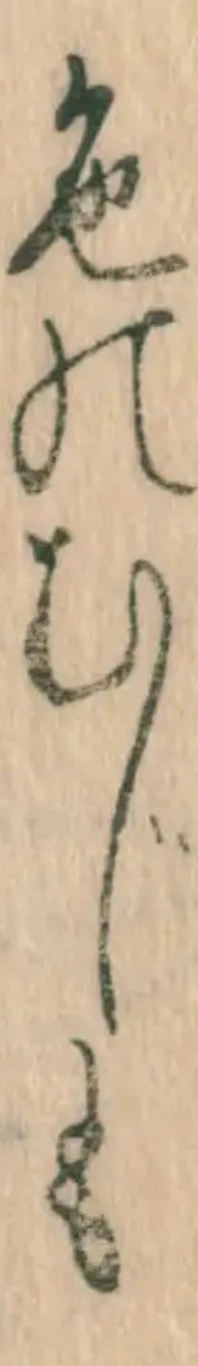色のむじも
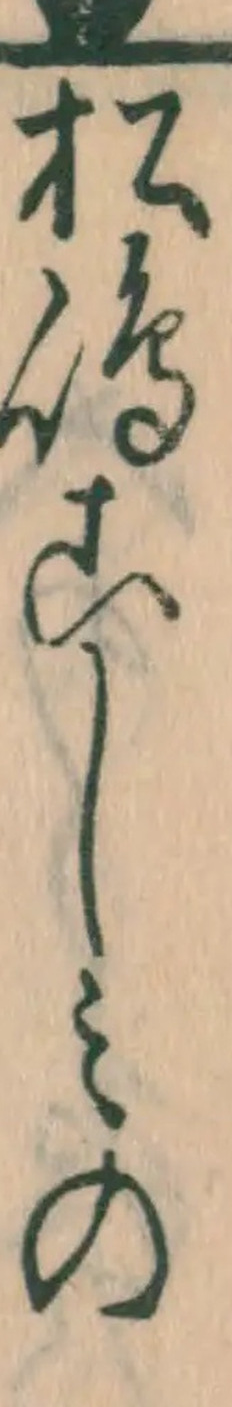●松嶋こしみの
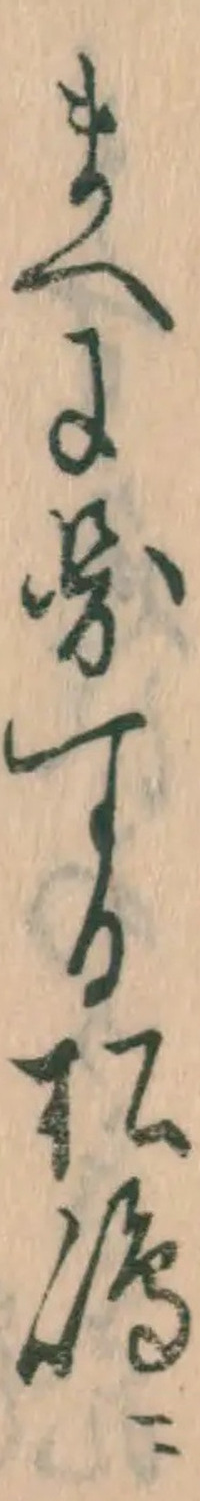まへに図する松嶋
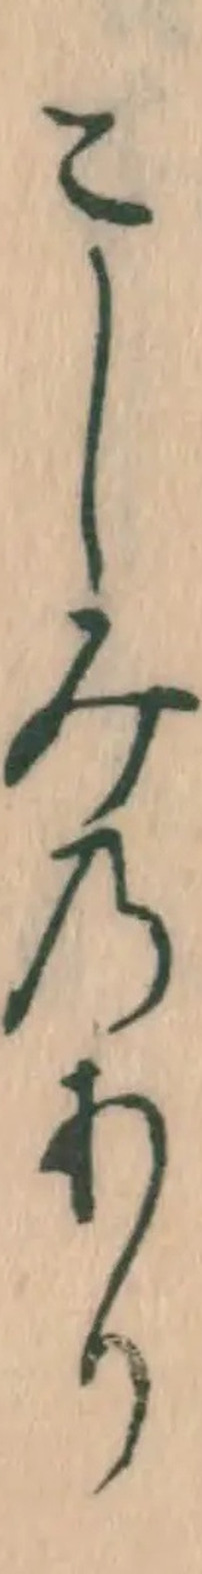こしみのあり
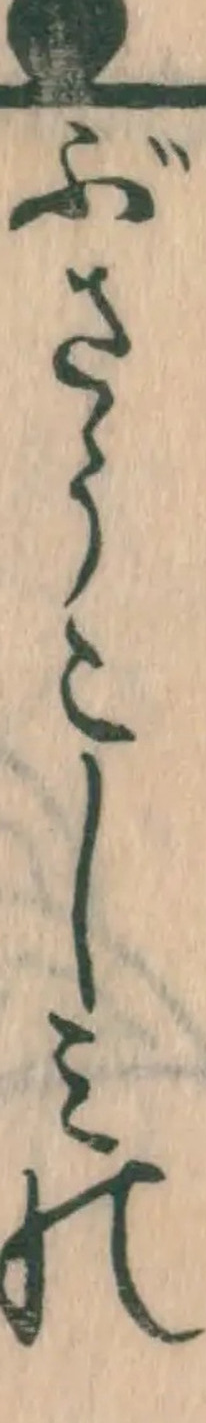●ぶさうこしみの
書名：錦繍枕 5巻. [5]
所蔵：国立国会図書館 National Diet Library, JAPAN
